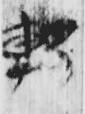○（範）
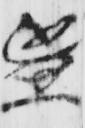○（竪）
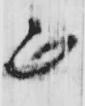㠯（以）
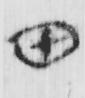田
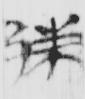邾
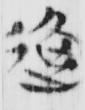○（路）
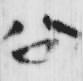公
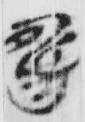𠷎（壽）
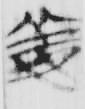義
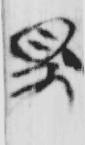○（得）
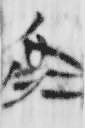爲
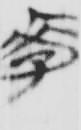李
